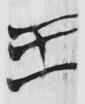王
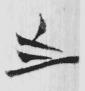之
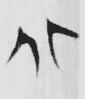北
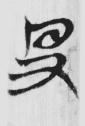{回又}
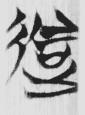迵
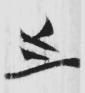之
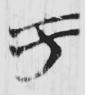于
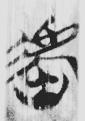{虎山}
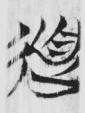道
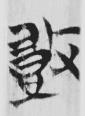敳
